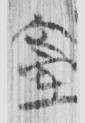{宀㞷}
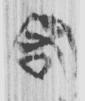宏
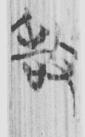{告攴}
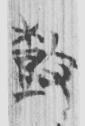{梪攴}
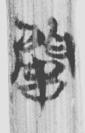{門串}
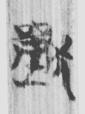{獸土}
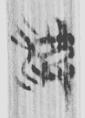波
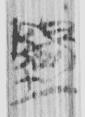{陽土}
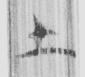土
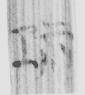{示工}
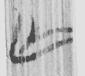亡
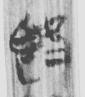既
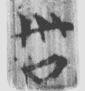{卅四}
